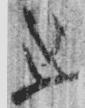之
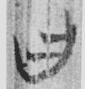曰
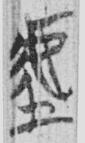○（吾）
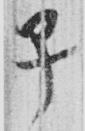子
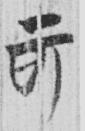可（何）
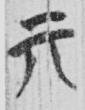亓（其）
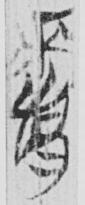○（瘠）
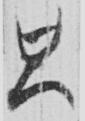也
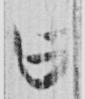曰
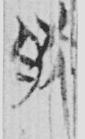肰（然）
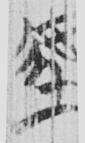○（吾）
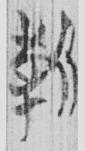新（親）
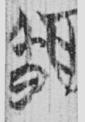○（聞）
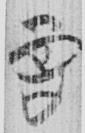言
